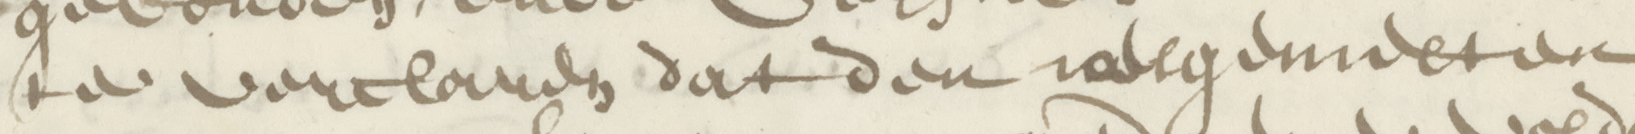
te verclaren dat den welgemelten
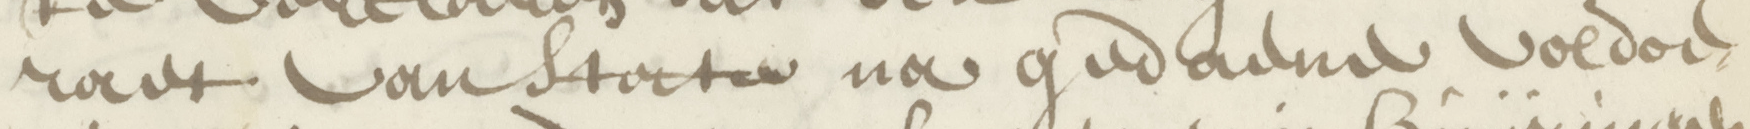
raet van State na gedaene voldoe„
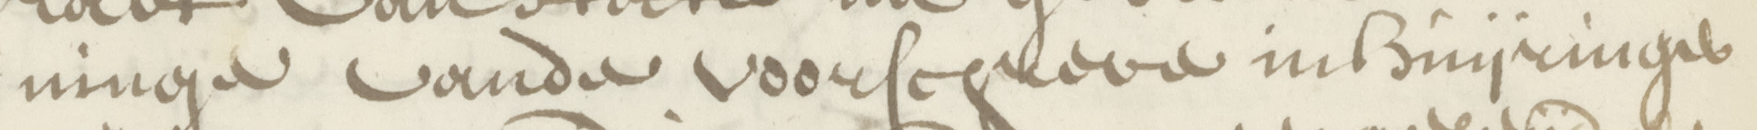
ninge vande voorschreve inhuijringe
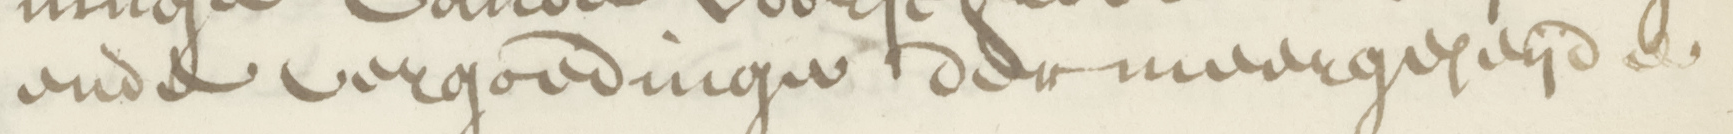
ende vergoedinge der meergeseijde
